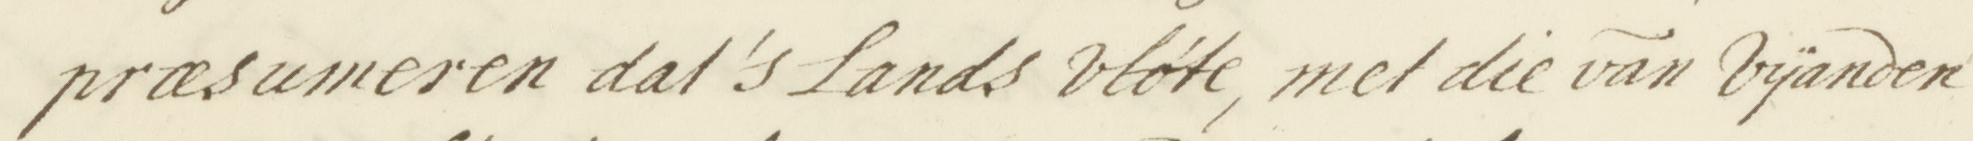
præsumeren dat 's Lands vlote, met die van vijanden
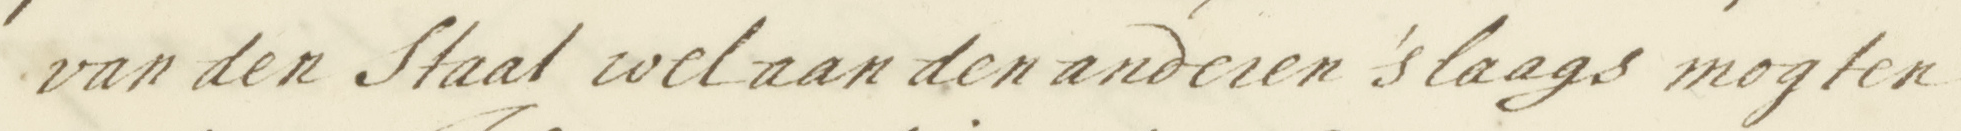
van den Staat wel aan den anderen 'slaags mogten
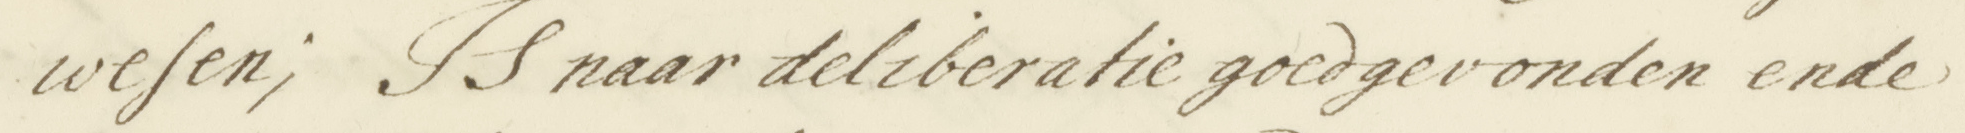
wesen; Is naar deliberatie goedgevonden ende
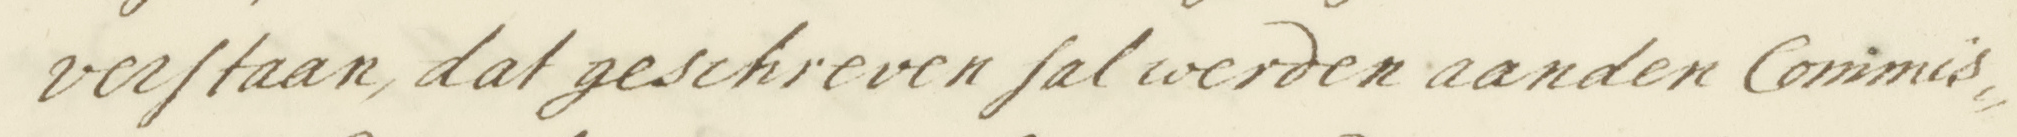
verstaan, dat geschreven sal werden aan den Commis„
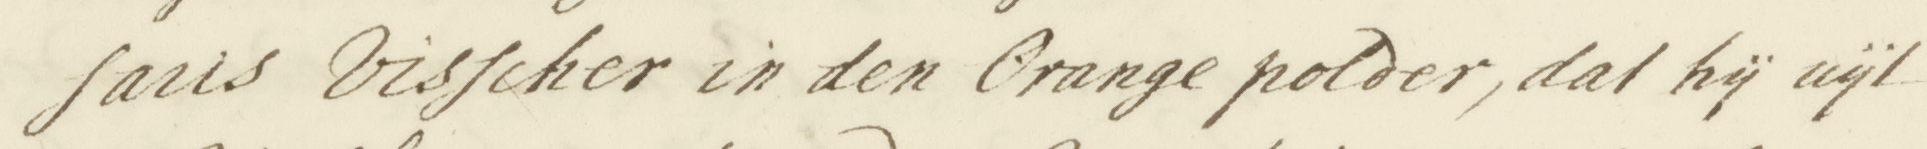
saris visscher in den Orange polder, dat hij uijt
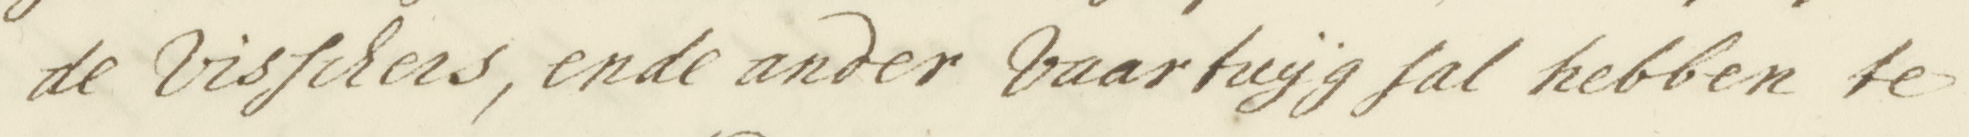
de visschers, ende ander vaartuijg sal hebben te
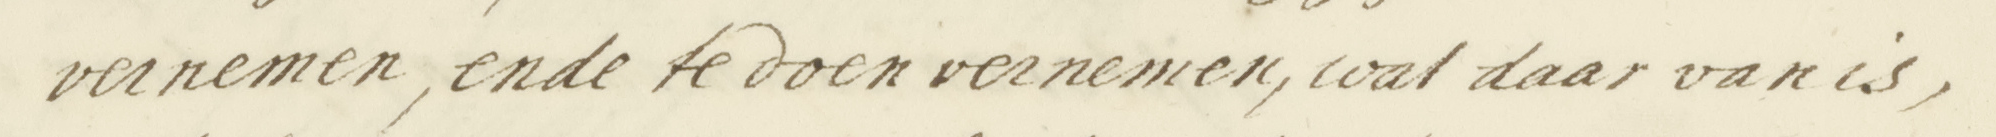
vernemen, ende te doen vernemen, wat daar van is,
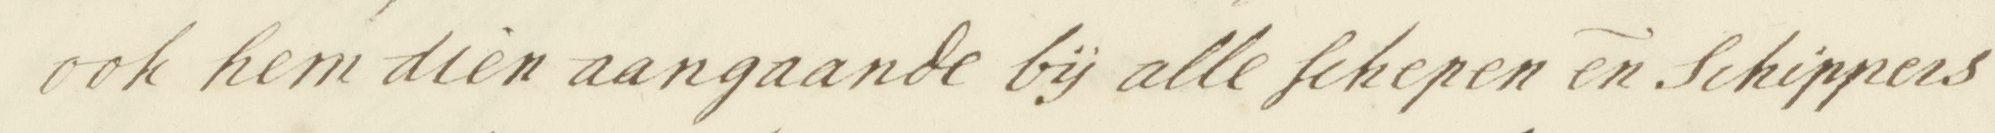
ook hem dien aangaande bij alle schepen en schippers
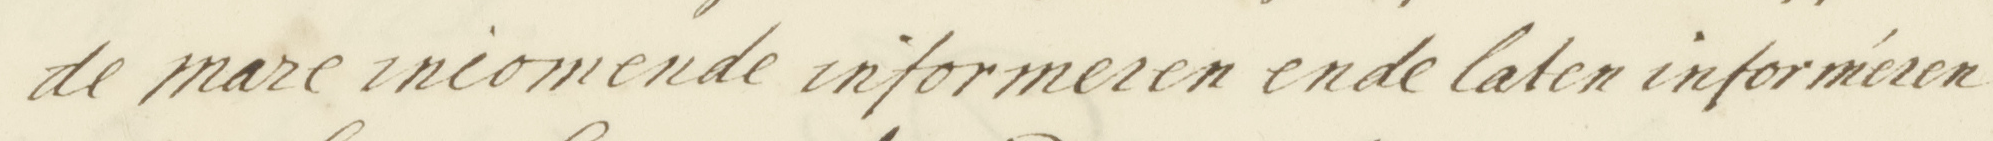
de mare incomende informeren ende laten informeren
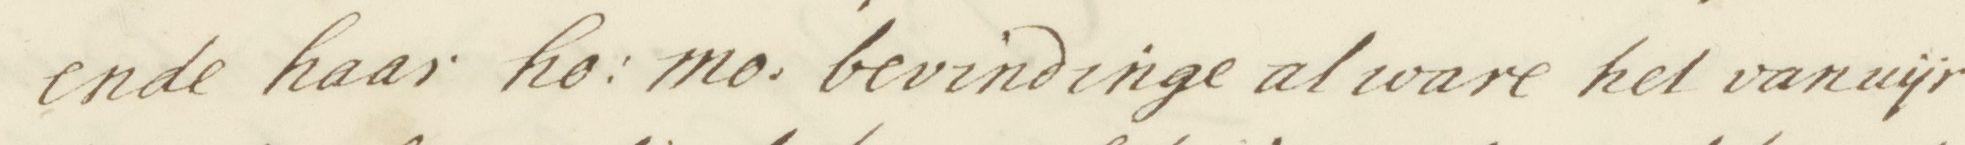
ende haar ho:mo: bevindinge al ware het van uijr
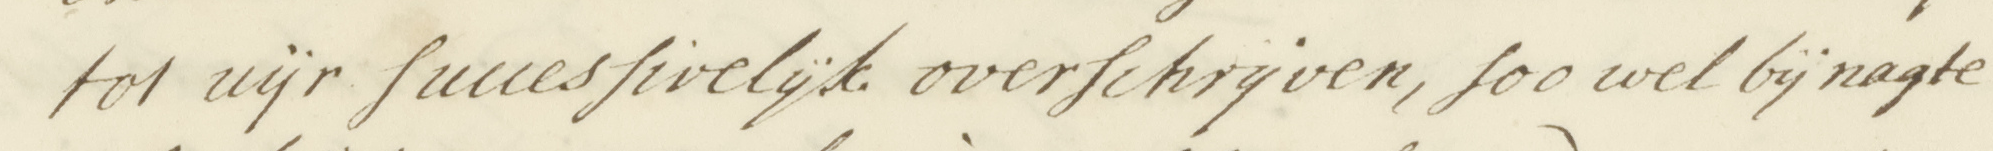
tot uijr successivelijk overschrijven, soo wel bij nagte
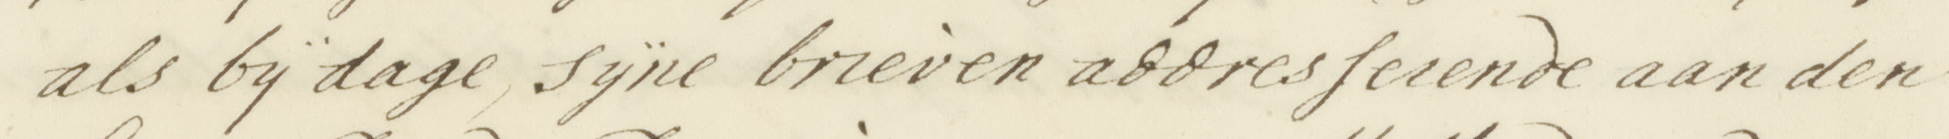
als bij dage, sijne brieven addresserende aan den
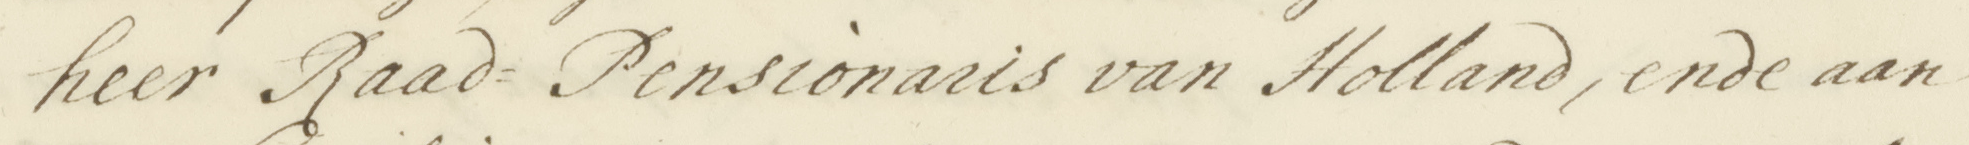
heer Raad= Pensionaris van Holland, ende aan
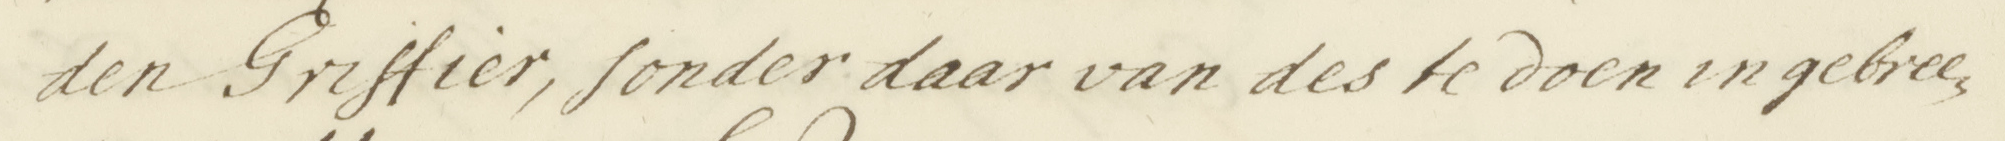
den Griffier, sonder daar van des te doen in gebree„
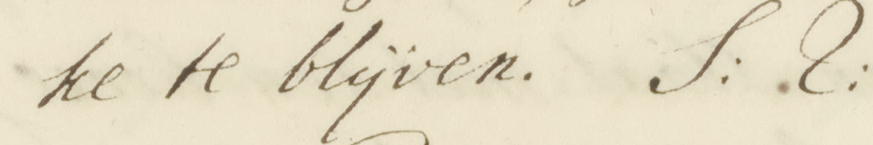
ke te blijven. S: R:
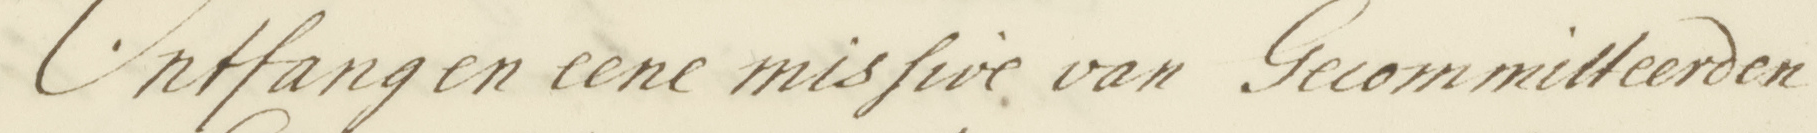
Ontfangen eene missive van Gecommitteerden
